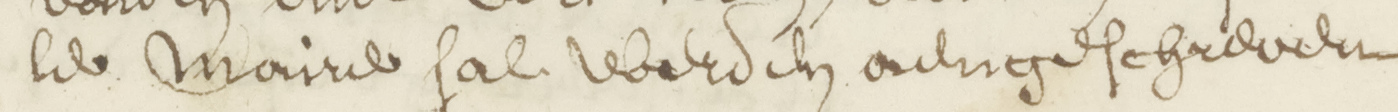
le Maire sal werden aengeschreven
